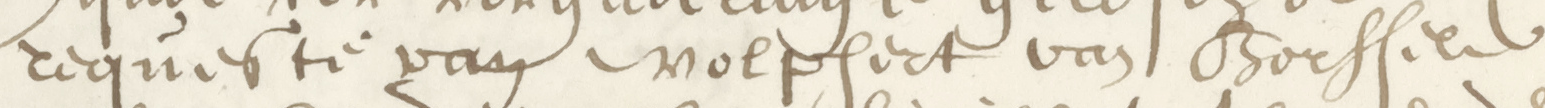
requeste van Wolphert van Borssele
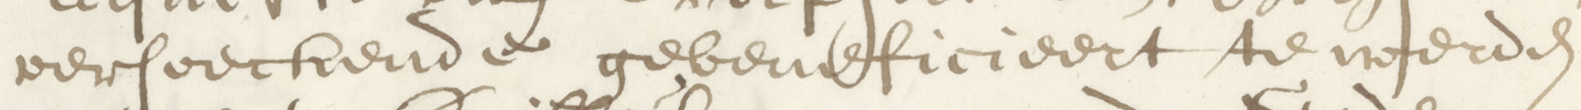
versoeckende gebeneficieert te werden
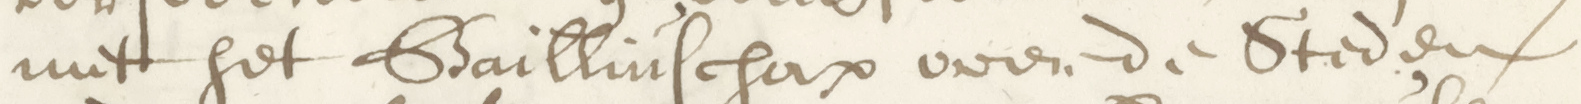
met het Bailliuschap over de Steden
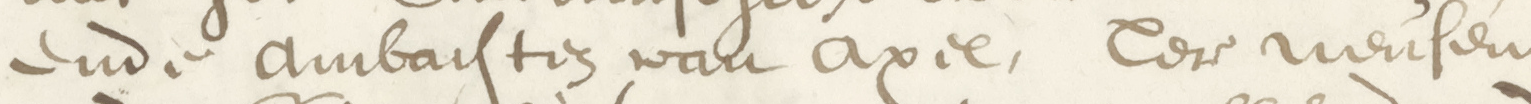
ende Ambachten van Axel, Ter Neusen,
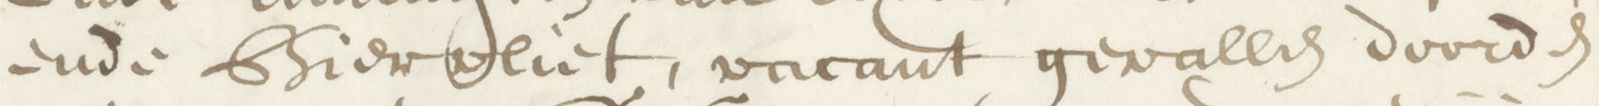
ende Biervliet, vacant gevallen doorden
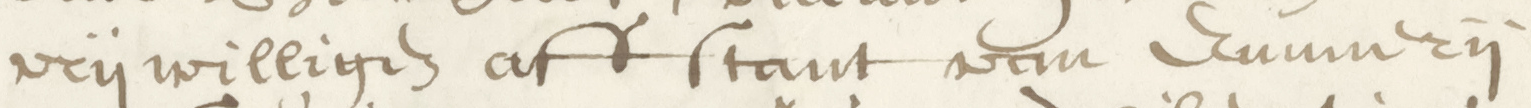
vrijwilligen affstant van Emmerij
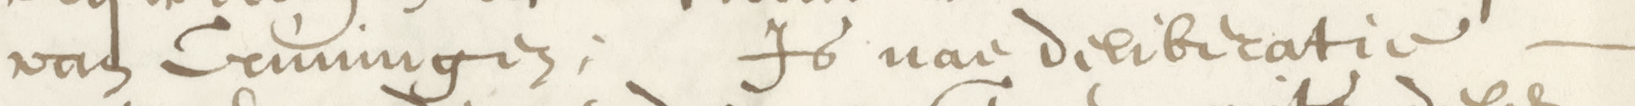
van Cruningen; Is nae deliberatie
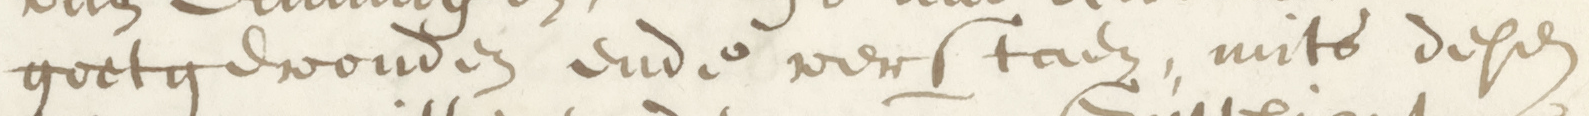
goetgevonden ende verstaen, mits desen
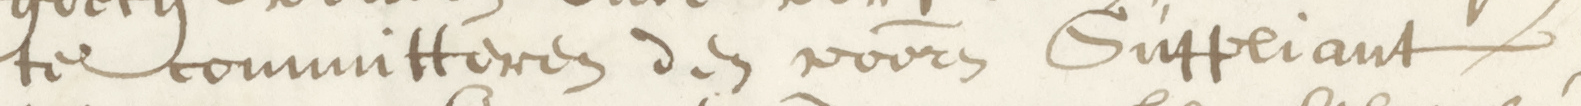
te committeren den voorn Suppliant
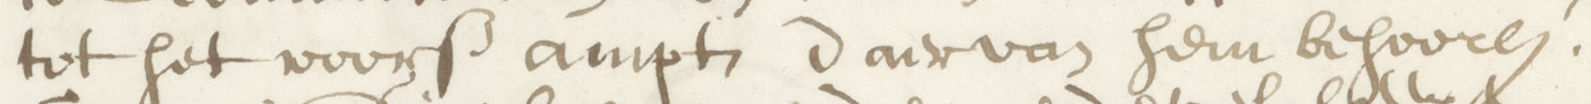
tot het voors. ampt, daervan hem behoorl.
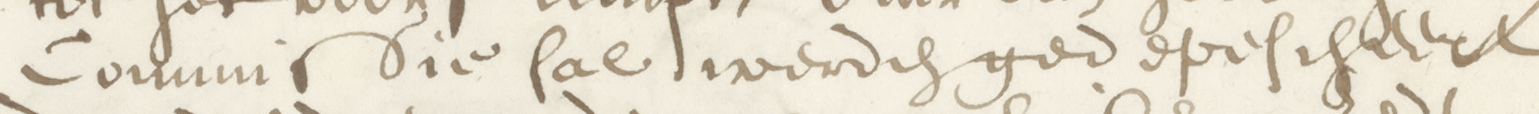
Commissie sal werden gedepescheert
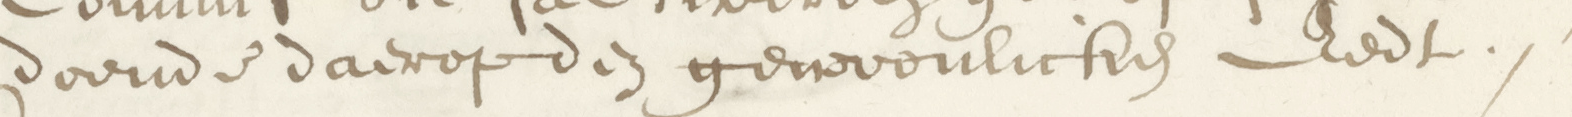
doende daerop den gewoonlicken Eedt.
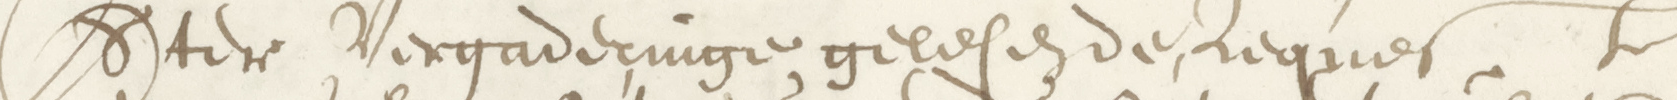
Is ter Vergaderinge gelesen de Requeste
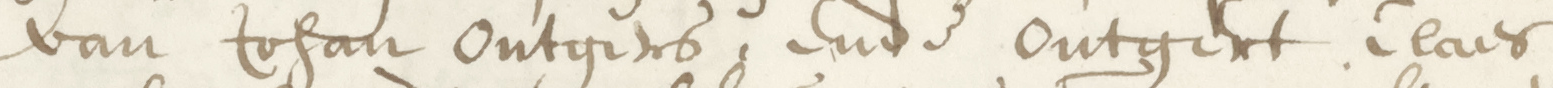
van Johan Outgers, ende Outgert Claes,
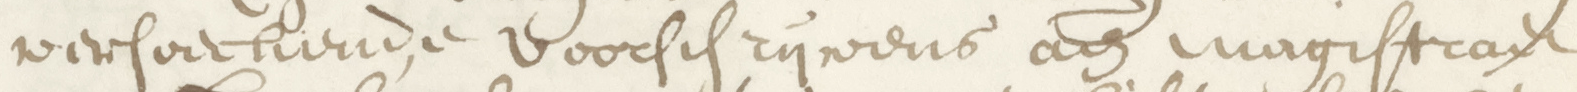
versoeckende voorschrijvens aen magistraet
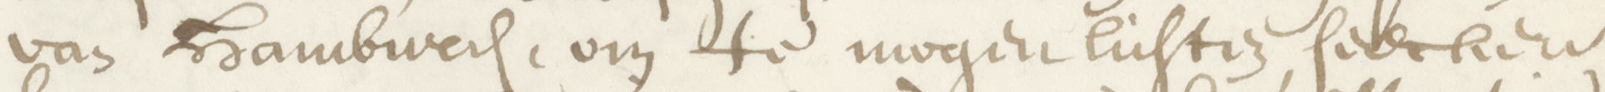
van Hamburch, om te mogen lusten seeckere
